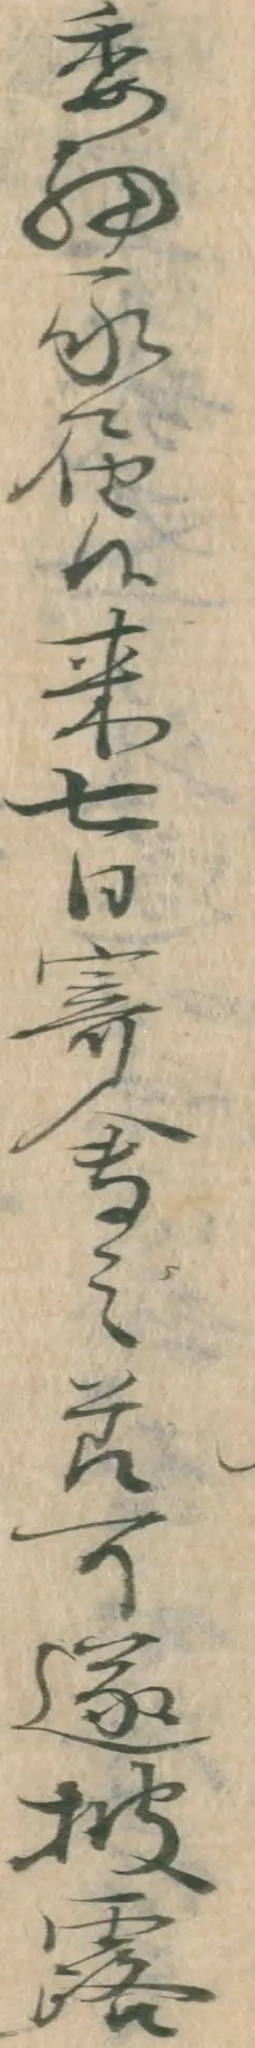委細承届候来七日寄会之節可遂披露
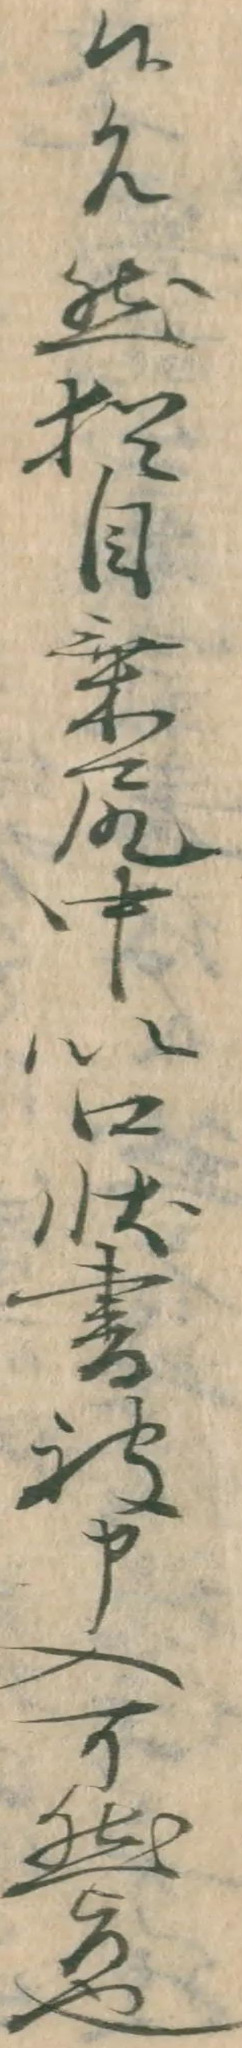候乍然猶自乗尻中以口状書被申入可然旨也
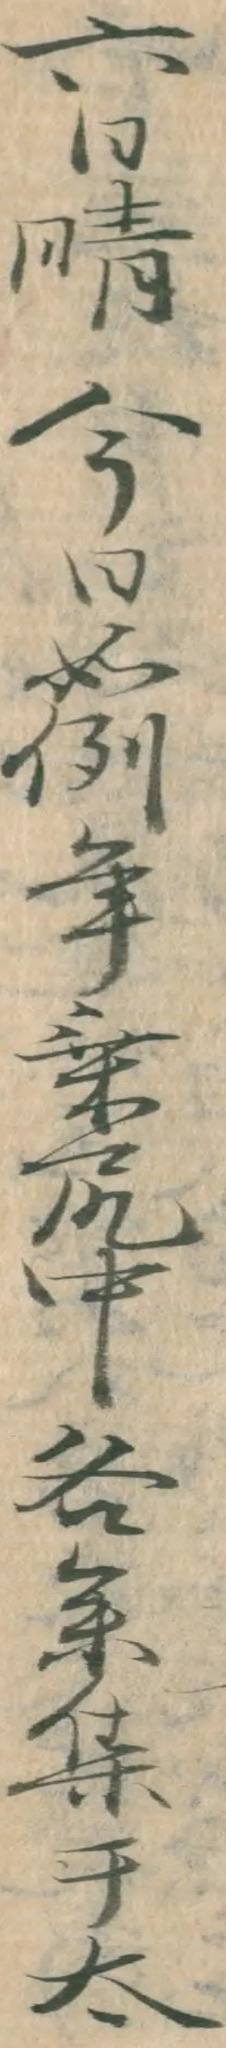六日晴今日如例年乗尻中各参集于
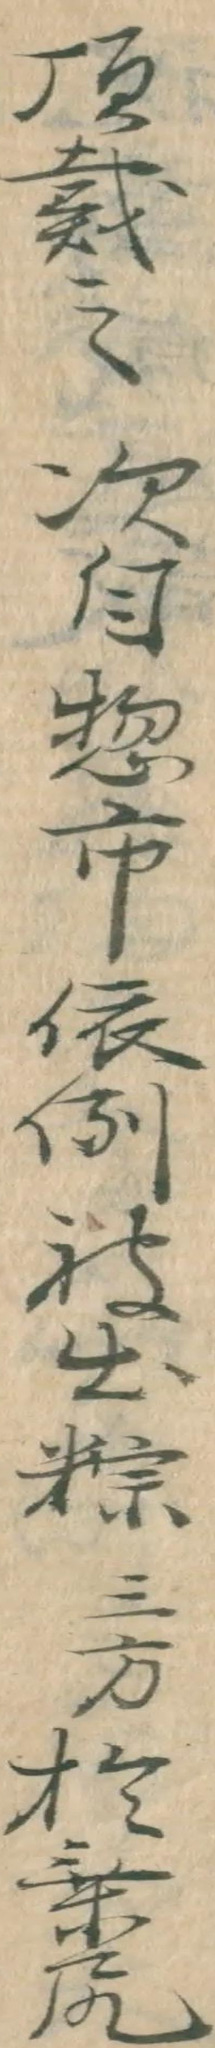頂戴之次自惣市依例被出粽三方於乗尻
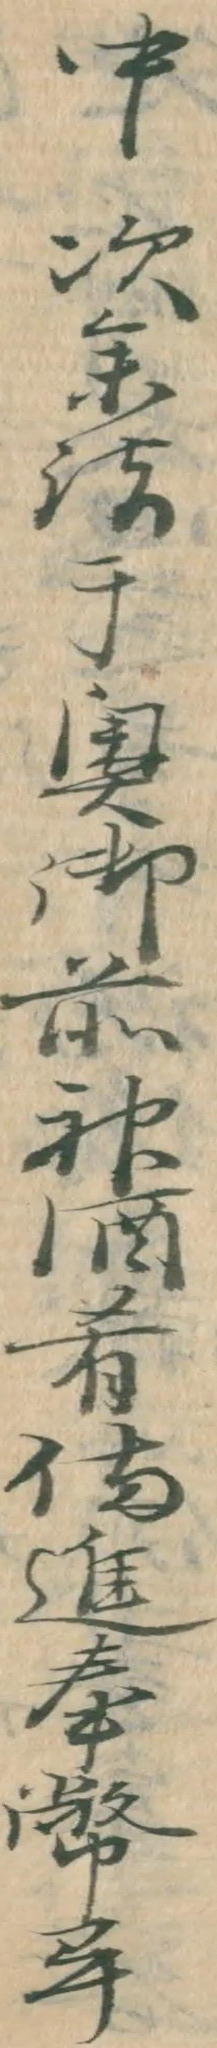中次参詣于奥御前神酒肴備進奉幣畢

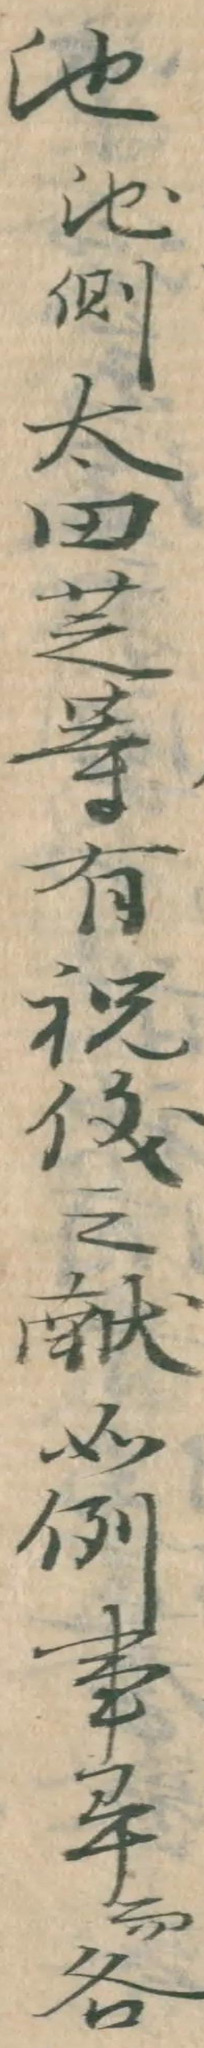池池側太田芝等有祝儀之献如例事畢而各
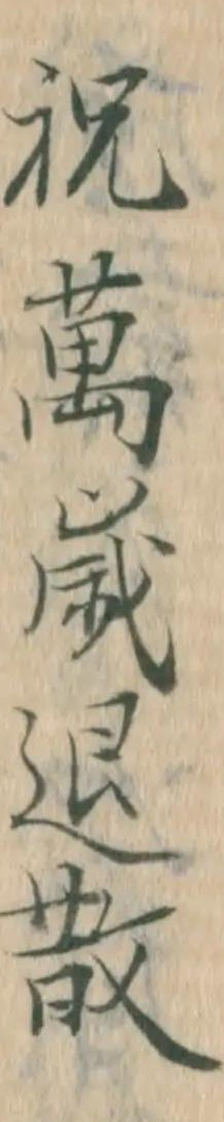祝万歳退散
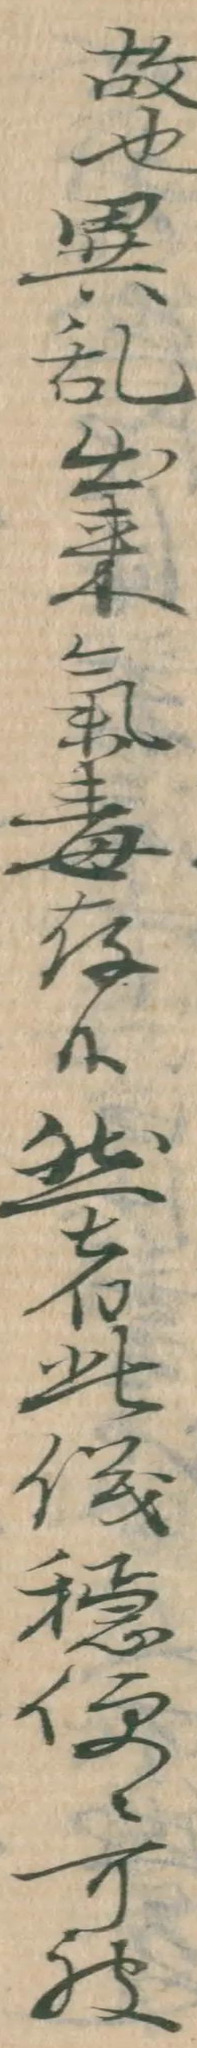故也異乱出来気毒存候然者此儀穏便ニ可致
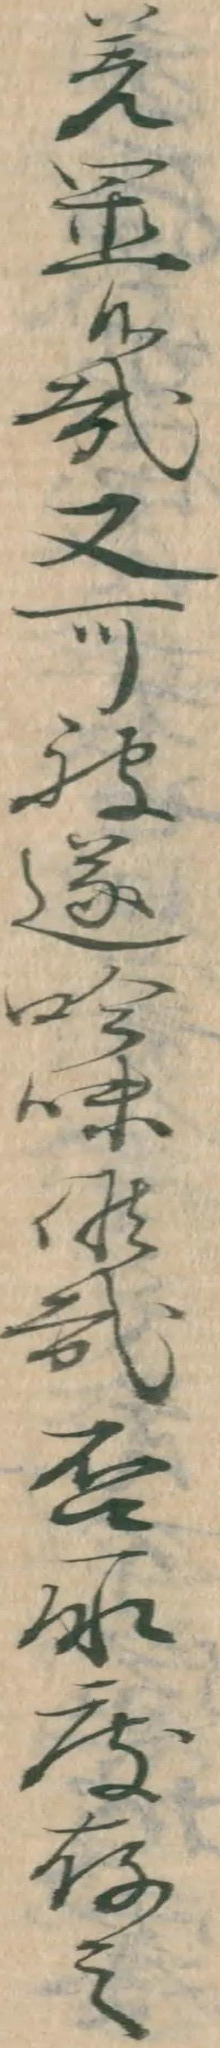差置候哉又可被遂吟味候哉否承度存之
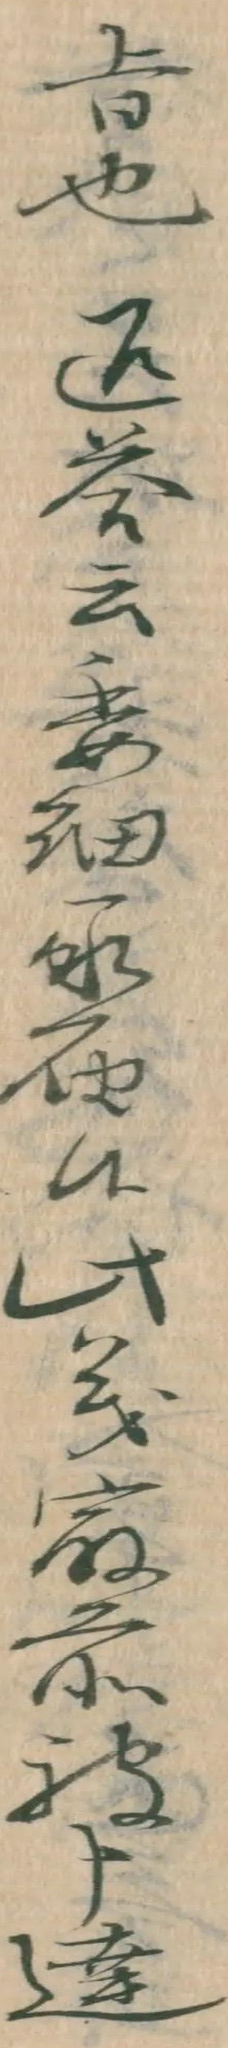旨也返答云委細承届候此義最前被申達
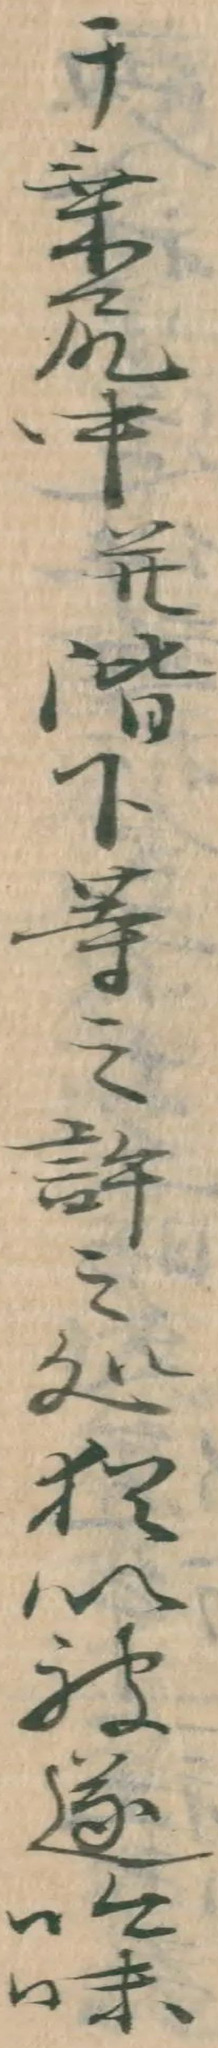于乗尻中并階下等之許之処猶以被遂吟味
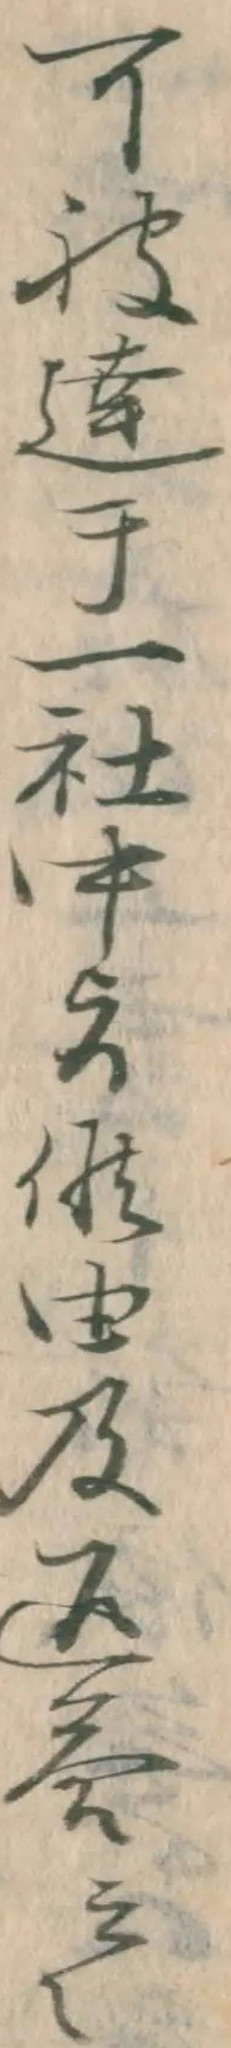可被達于一社中旨候由及返答云々
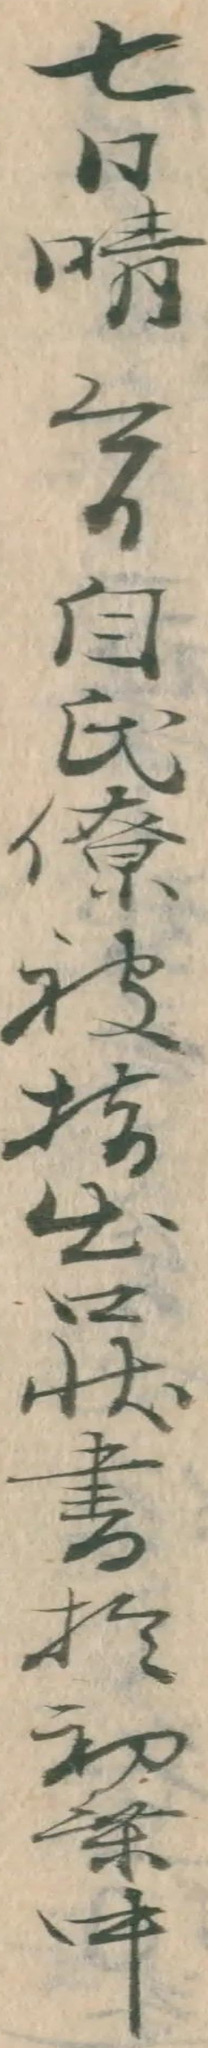七日晴今日自氏僚被指出口状書於初乗中
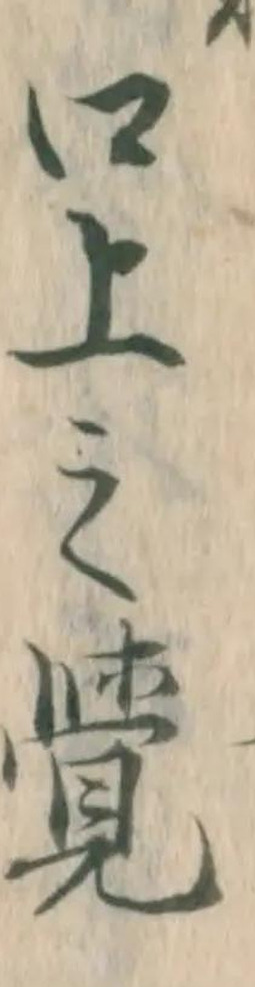口上之覚
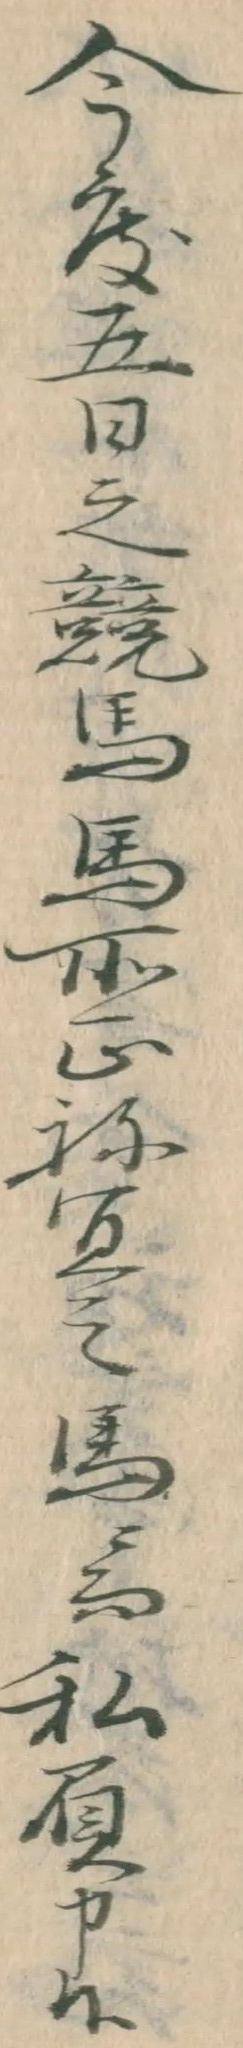今度五日之競馬馬所正祢宜之馬ニ而私負申候
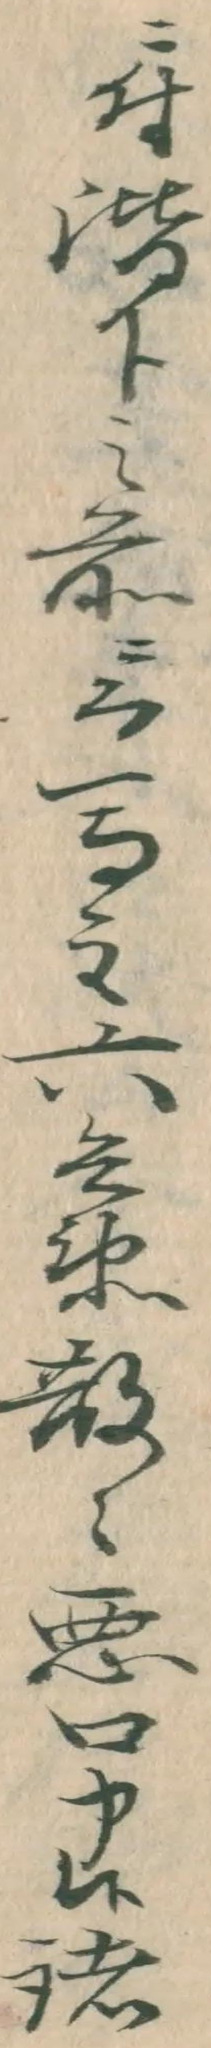ニ付階下之前ニ而馬主六兵衛散々悪口申候諸
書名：賀茂社記録. 第10冊
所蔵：国立国会図書館 National Diet Library, JAPAN
